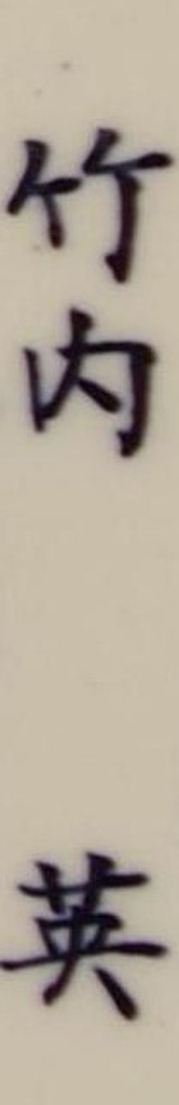竹内英
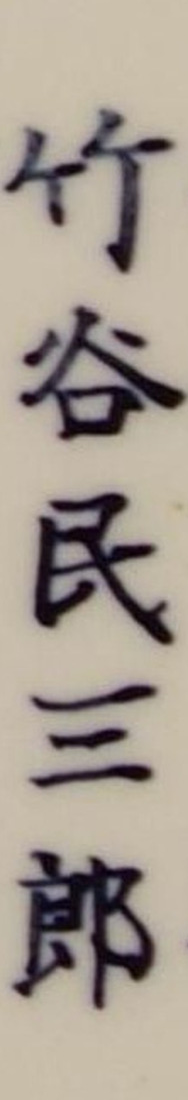竹谷民三郎
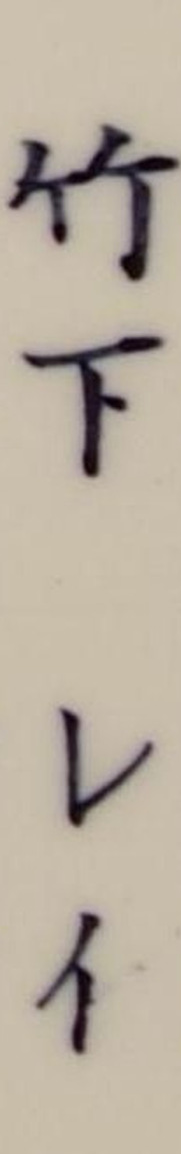竹下レイ
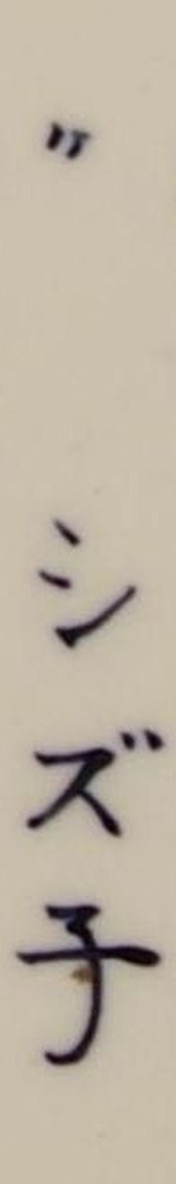シズ子
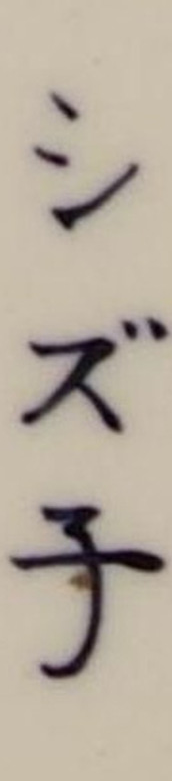シズ子
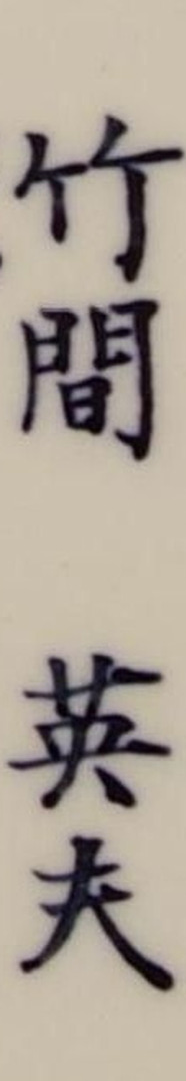竹間英夫
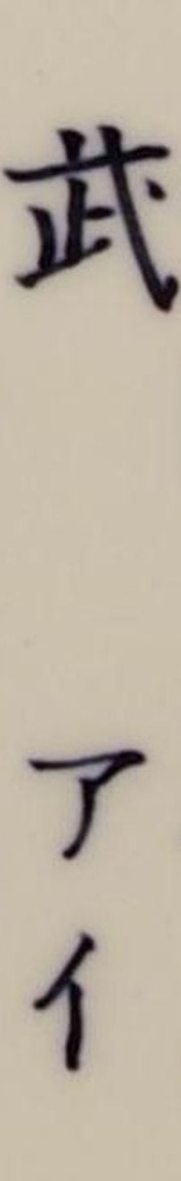武アイ
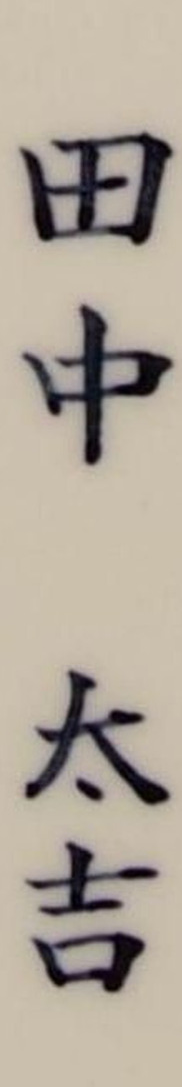田中太吉
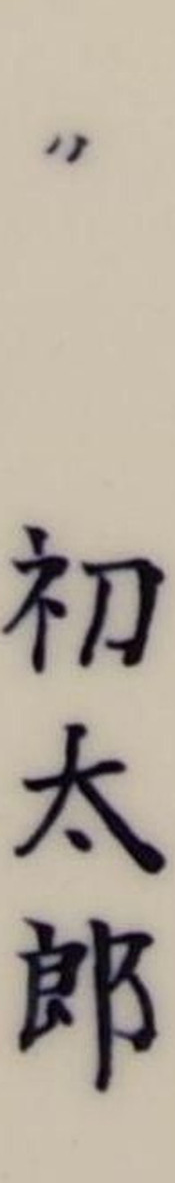初太郎
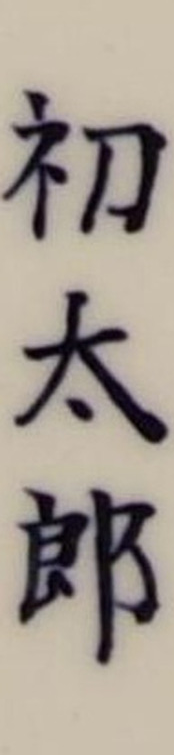初太郎
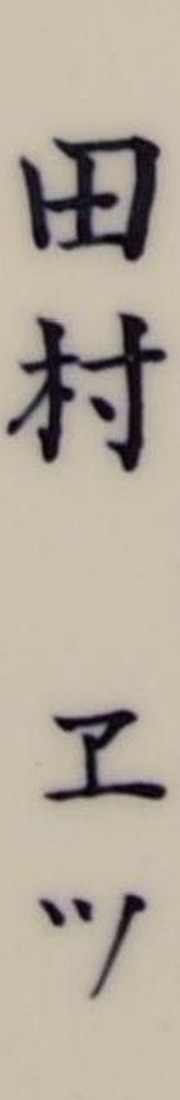田村エツ
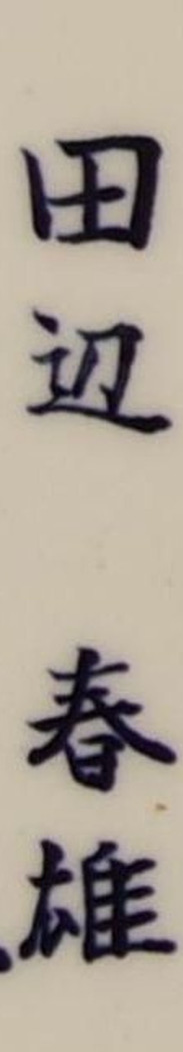田辺春雄
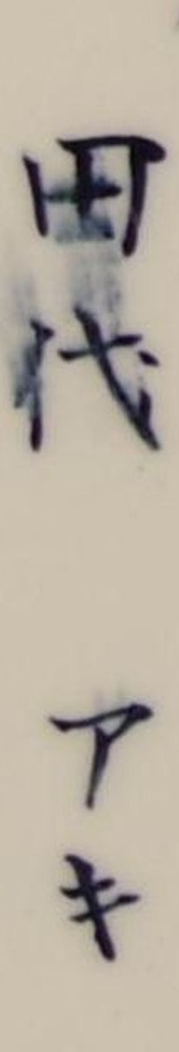田代アキ
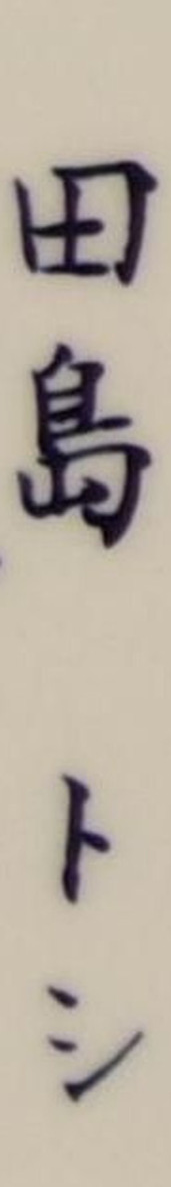田島トシ
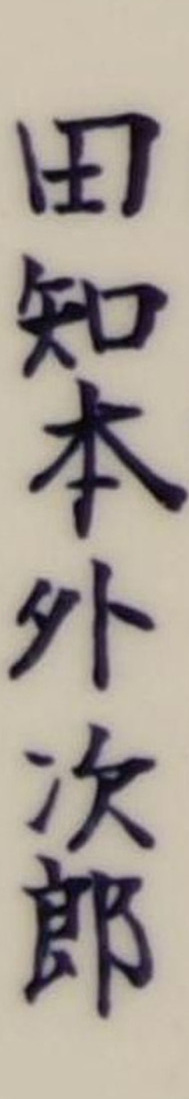田知本外次郎
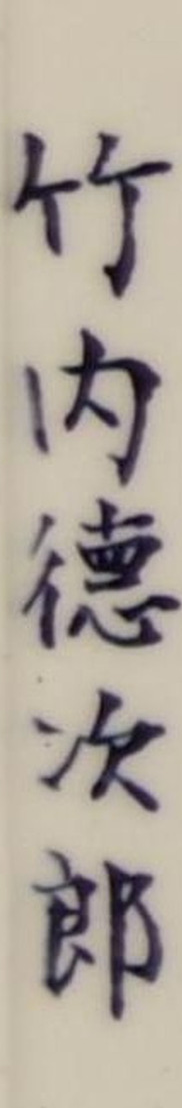竹内徳次郎
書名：M~S
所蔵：高野山金剛峯寺
